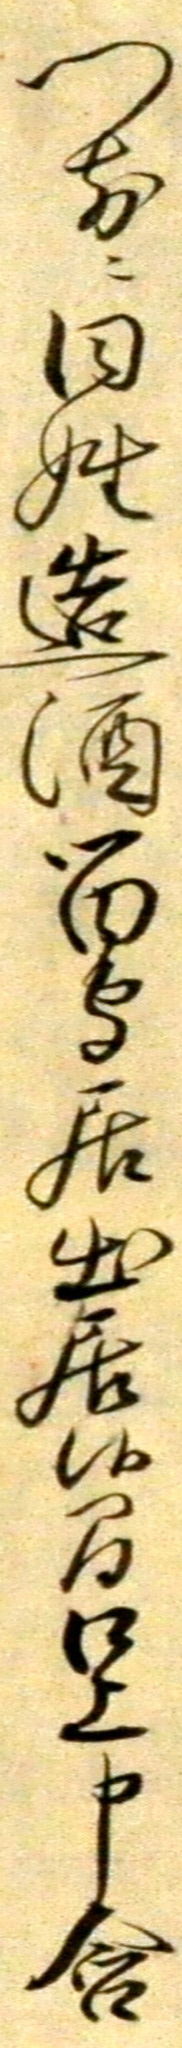門前ニ同姓造酒留守居出居候間口上申含
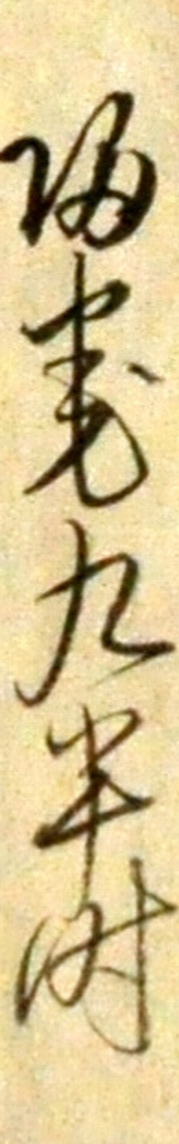帰宅九半時

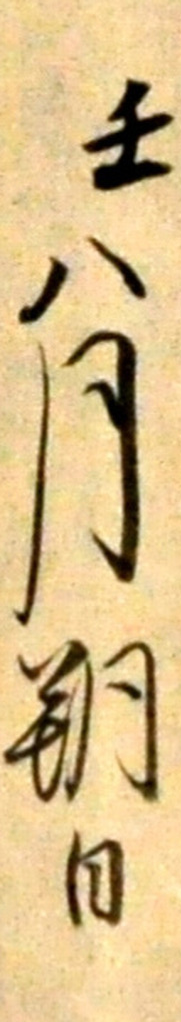閏八月朔日
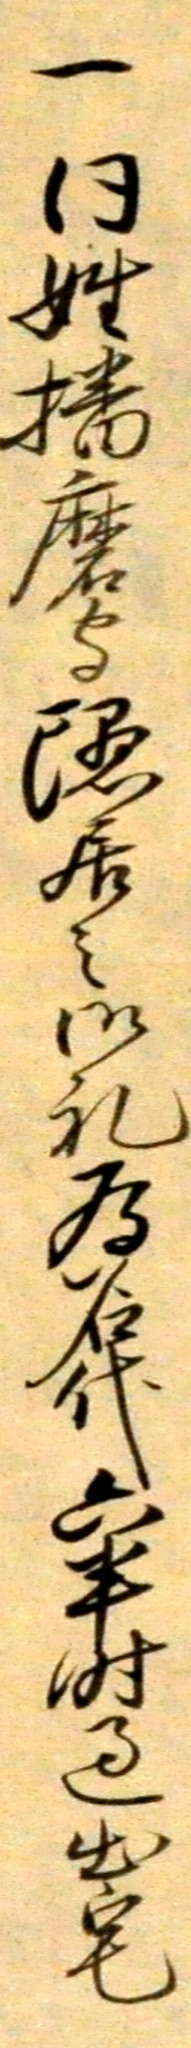一同姓播磨守隠居之御礼為名代六半時過出宅
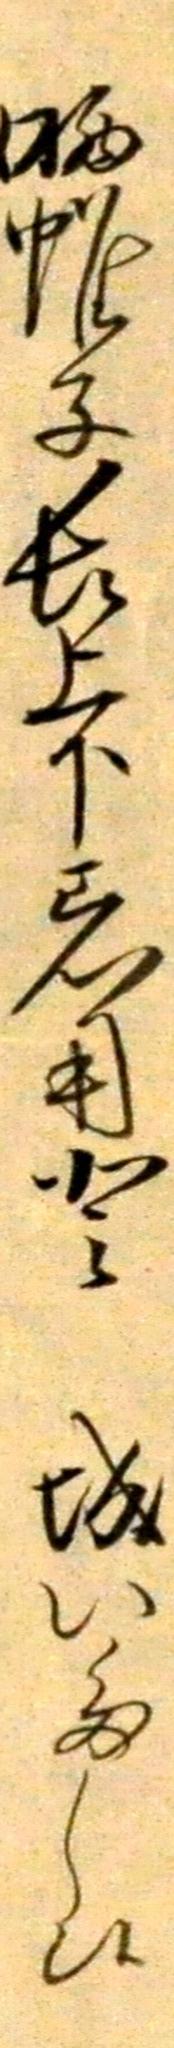晒帷子長上下着用登城いたし候
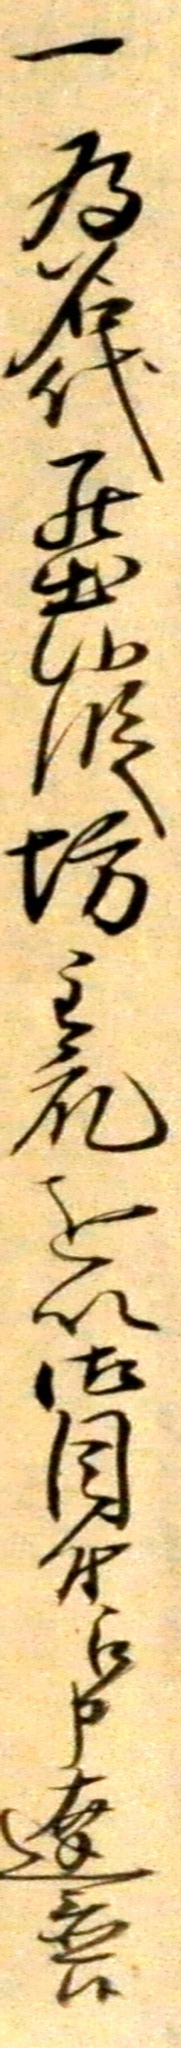一為名代罷出候段坊主衆を以御目付え申達置候
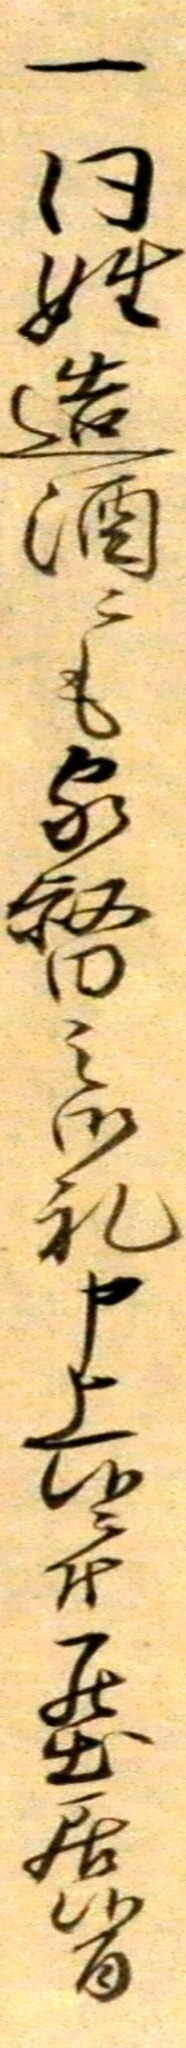一同姓造酒にも家督之御礼申上候ニ付罷出居候間
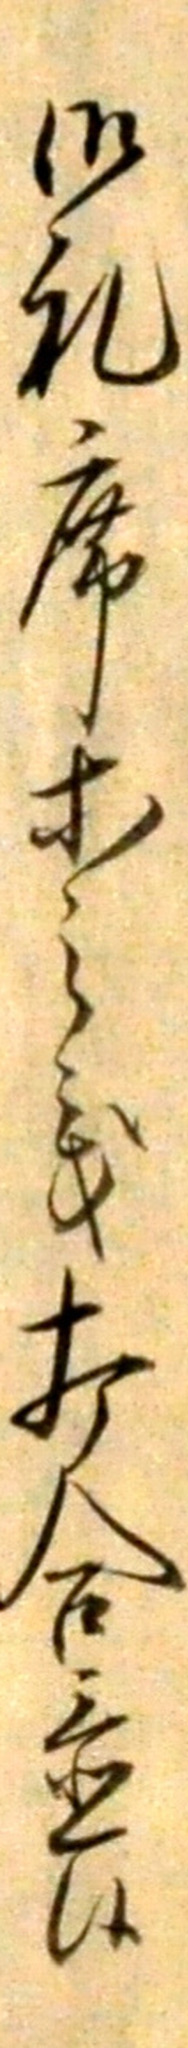御礼席等之義打合置候
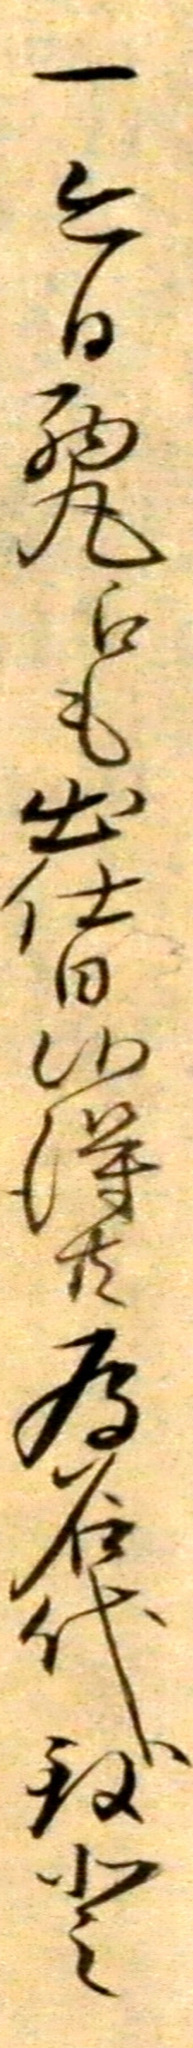一今日西丸えも出仕日候得共為名代致登
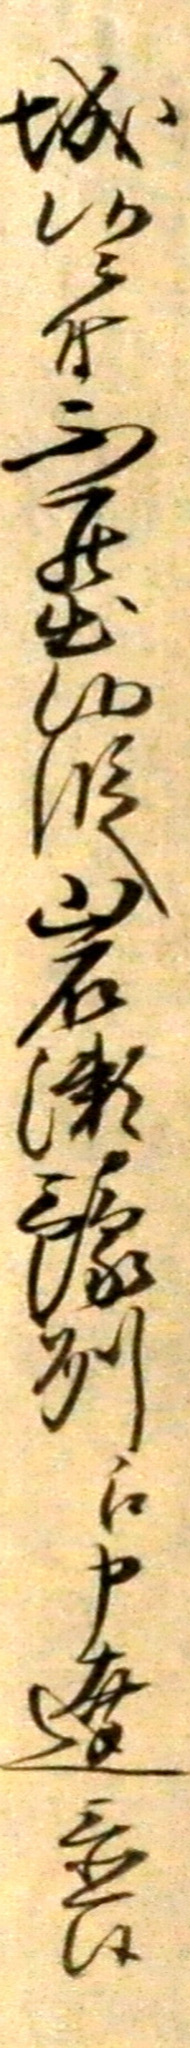城候ニ付不罷出候段岩瀬豫州え申達置候
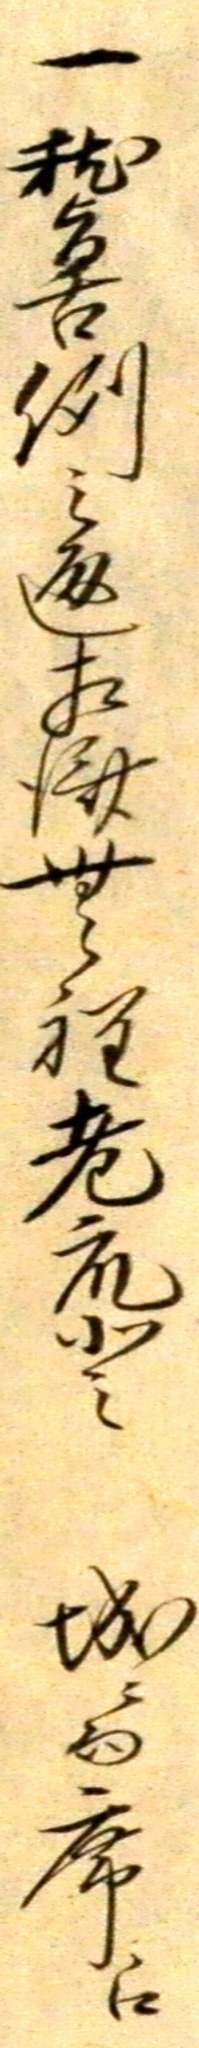一稽古例之通相済無程老衆登城ニ而席え
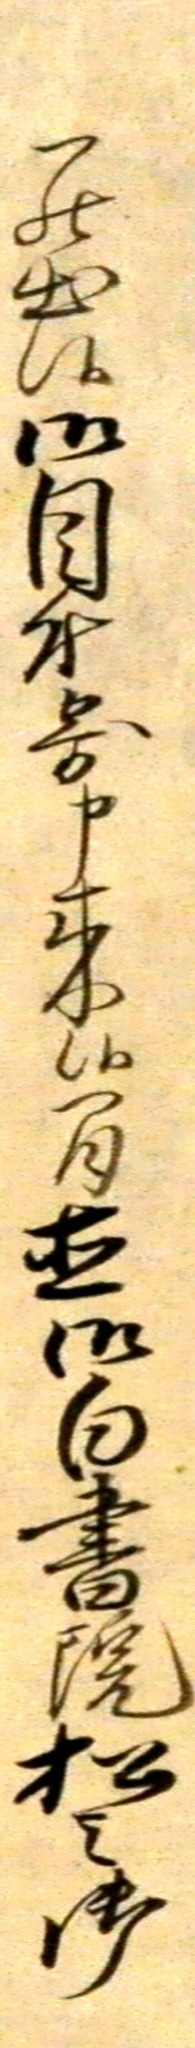罷出候御目付寄申来候間直御白書院松之御
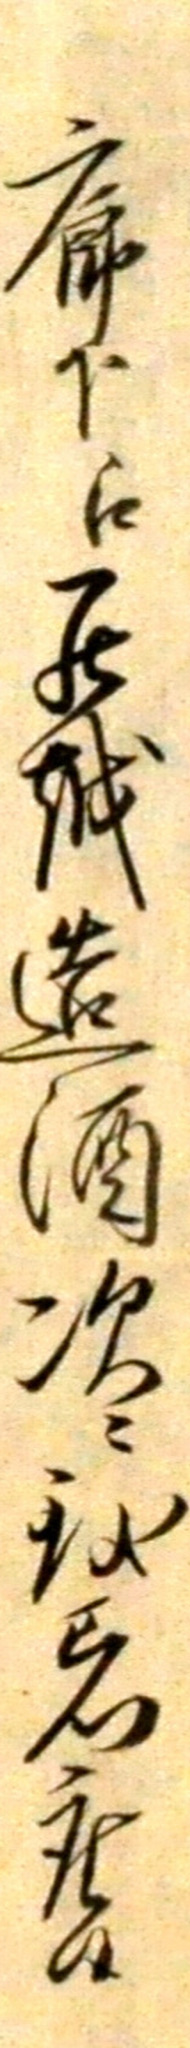廊下え罷越造酒次ニ致着座候
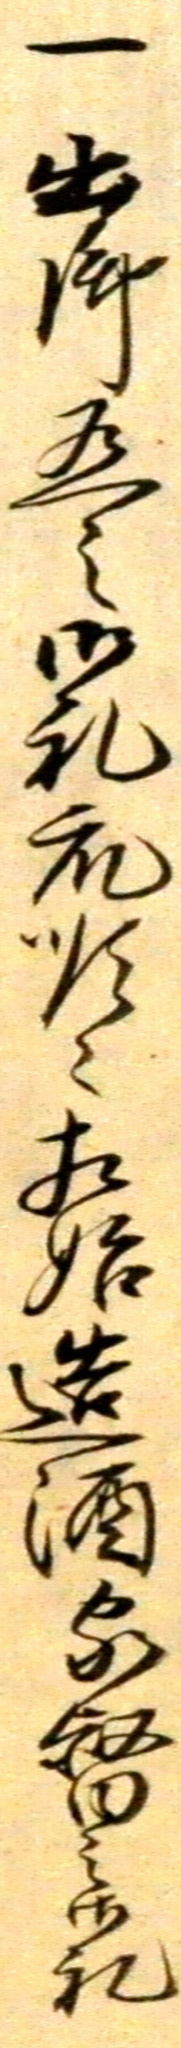一出御有之御礼衆順々相始造酒家督之御礼
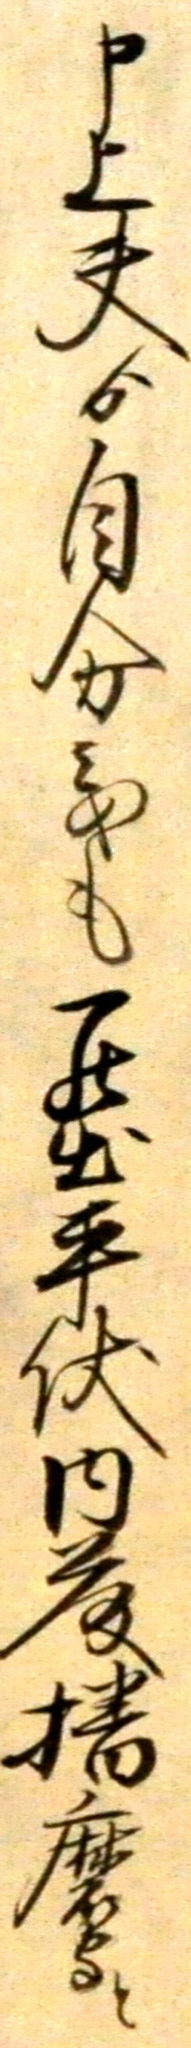申上夫ゟ自分義も罷出平伏内藤播磨守と
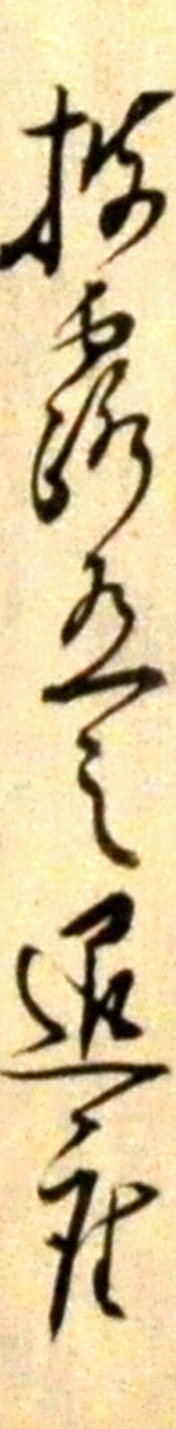披露有之退座
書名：諸名代相勤候節ノ留書外
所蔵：伊那市立高遠町図書館・合同会社AMANE
